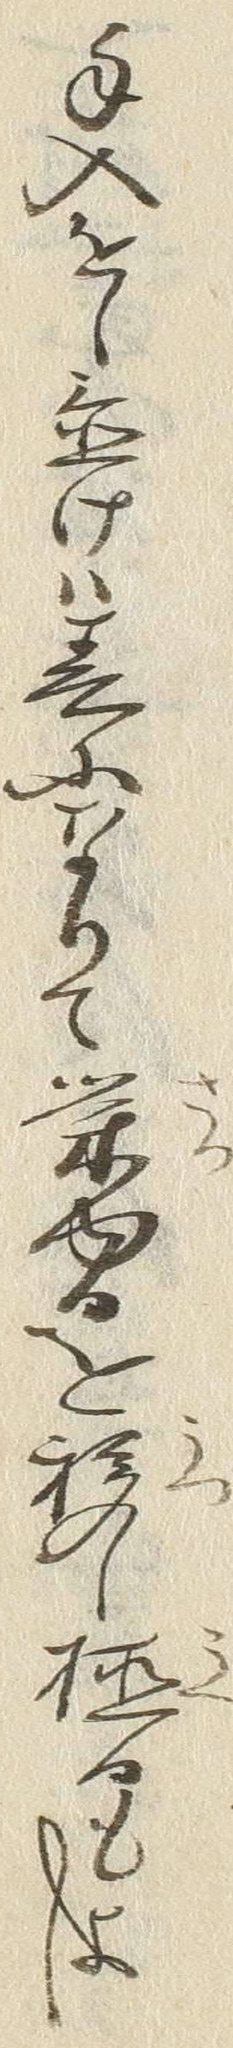手入をし置けは春尓なりて栄ゆるを移し植るもよし
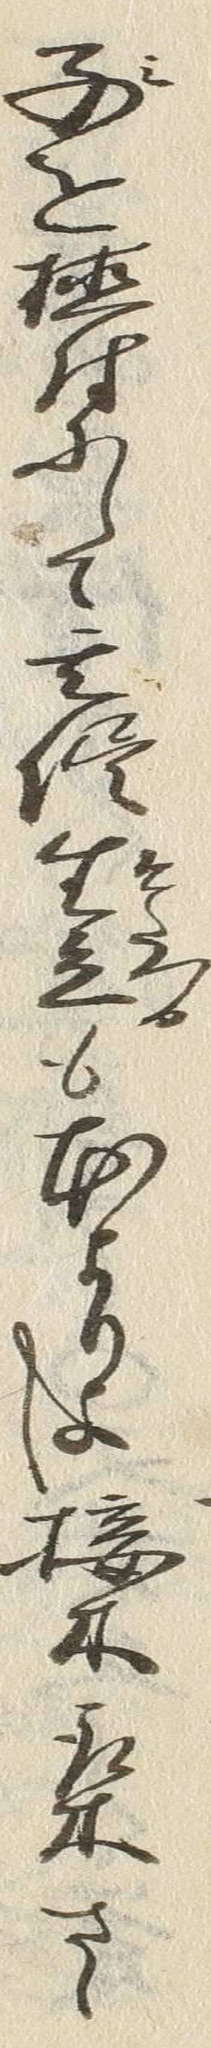子を植付尓して其侭生立も本よりよし接木取木さし
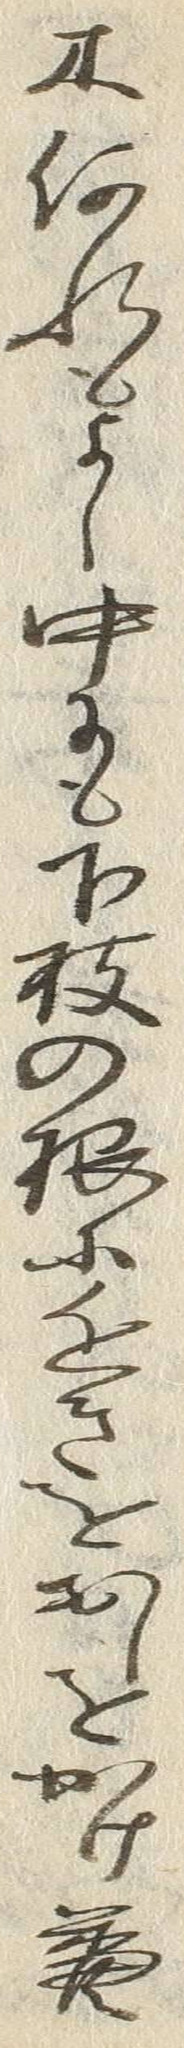木何れもよし中尓も下枝の根尓近きをあしをかけ糞
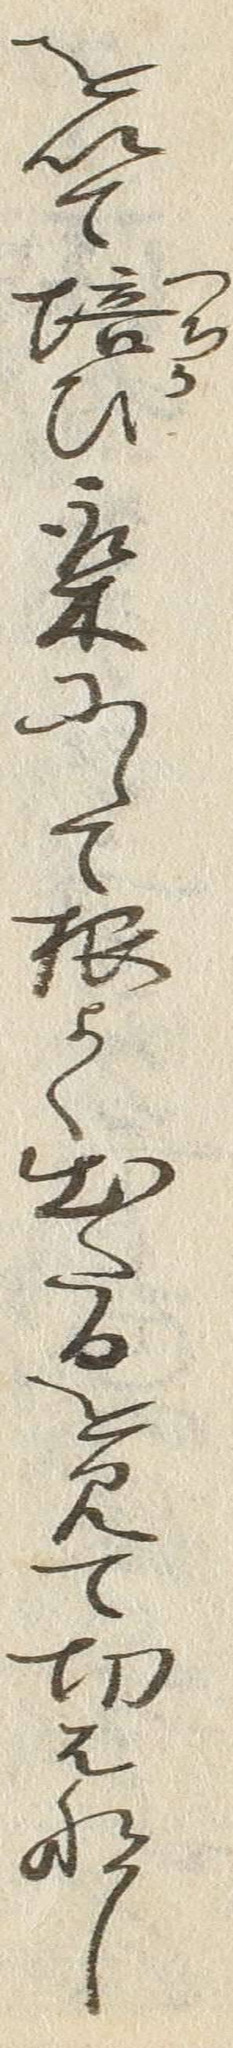を以て培ひ取木尓して根よく出たるを見て切は那し
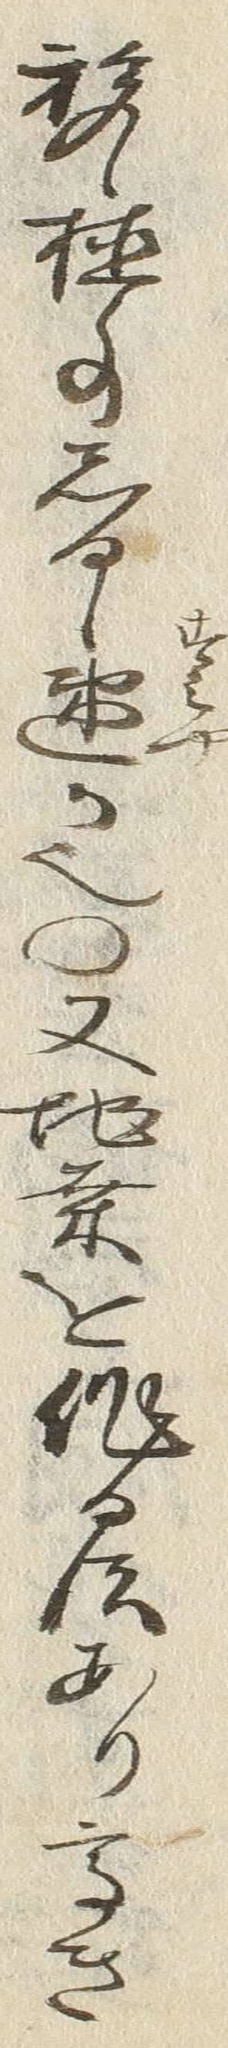移し植事志るし速か也〇又地桑を作る法あり高き
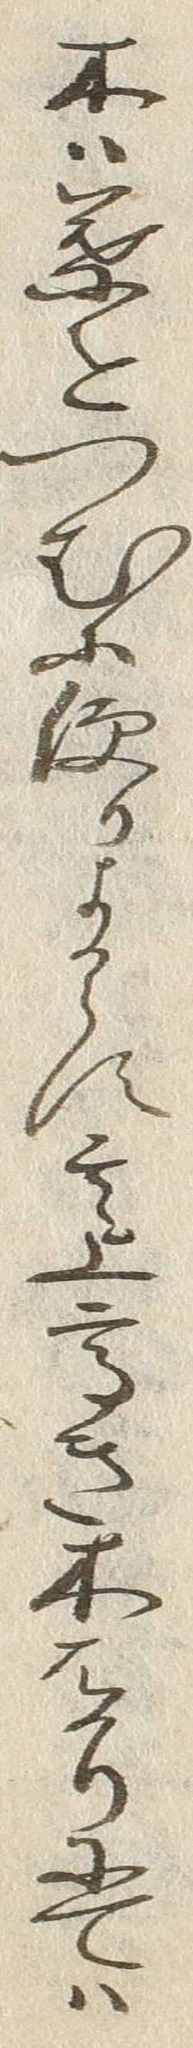木は葉をつむ尓便りよから須其上高き木はかり尓ては
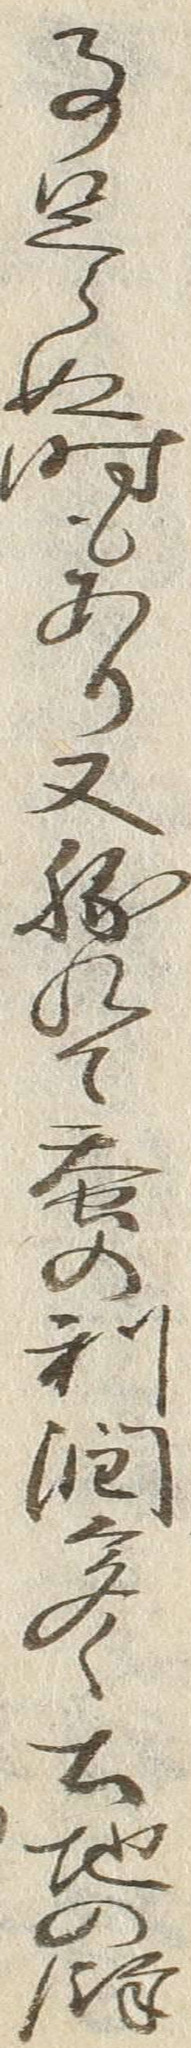事足らぬ時もあり又勝れて蚕の利潤多く土地の餘
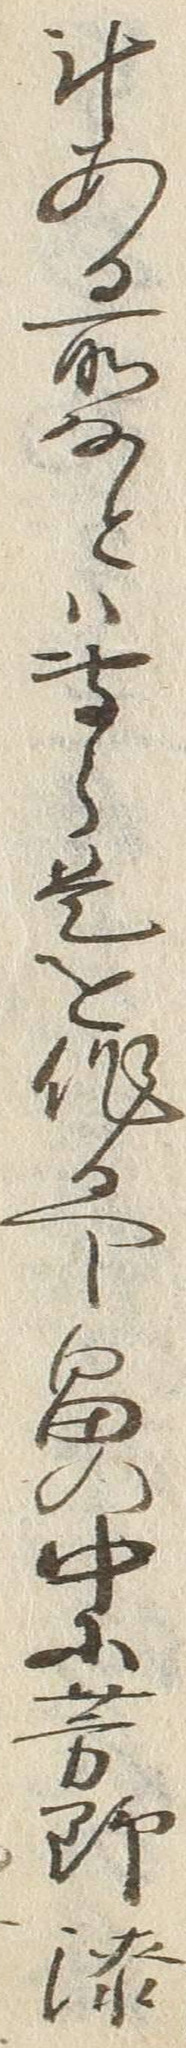斗ある所なとは専ら是を作るへし畠の中尓芳野漆
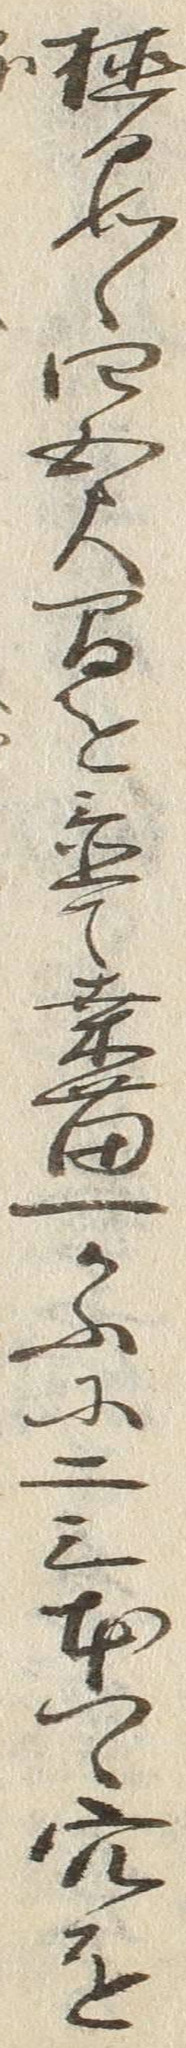植る如く四五尺間を置て桑苗一かふ尓二三本つゝ穴を
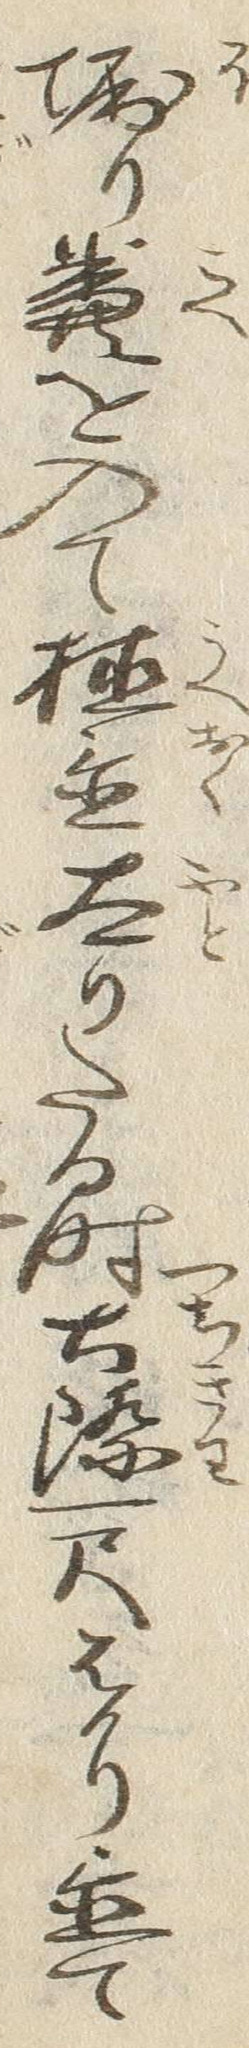堀り糞を入て植置太りたる時土際一尺はかり置て
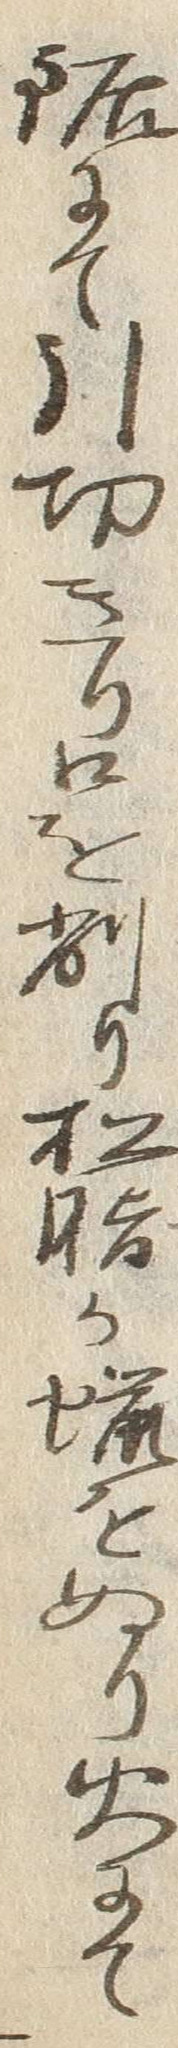鋸尓て引切きり口を削り松脂をぬり火尓て

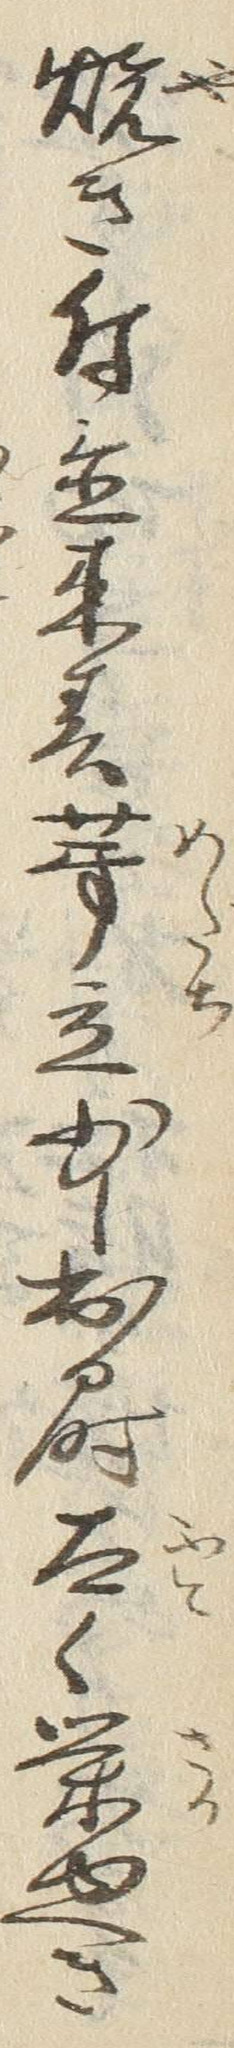焼き付置来春芽立少し出る時太く栄ゆへき
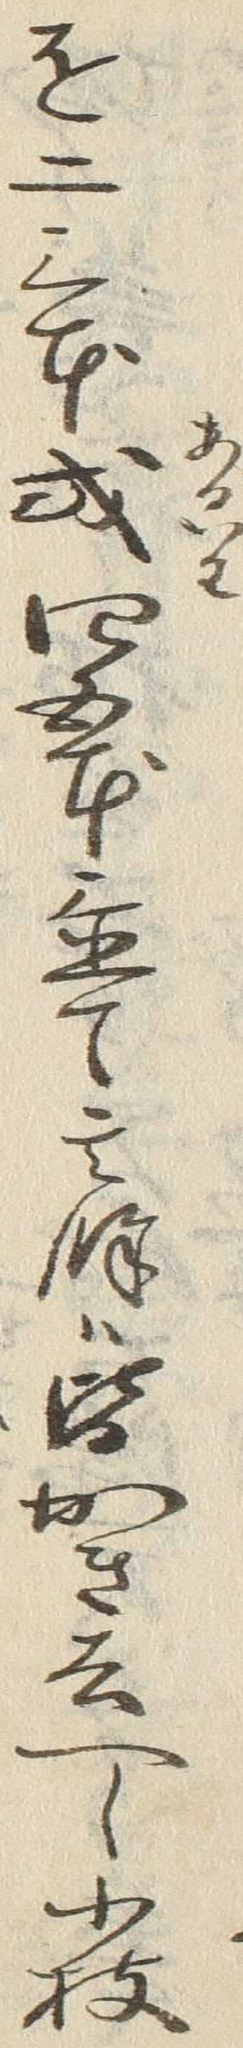を二三本或四五本置て其餘は皆かき去へし小枝
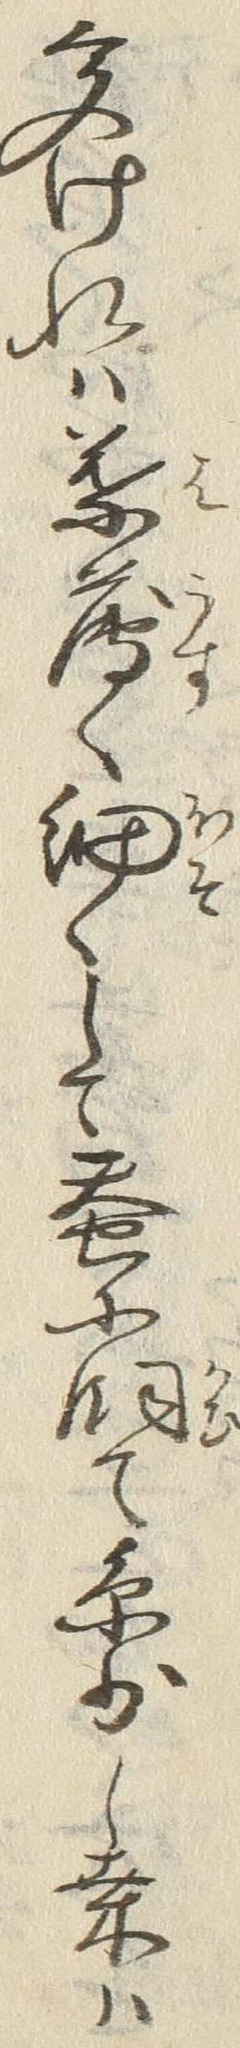多けれは葉薄く細くして蚕尓飼て糸少し桑は
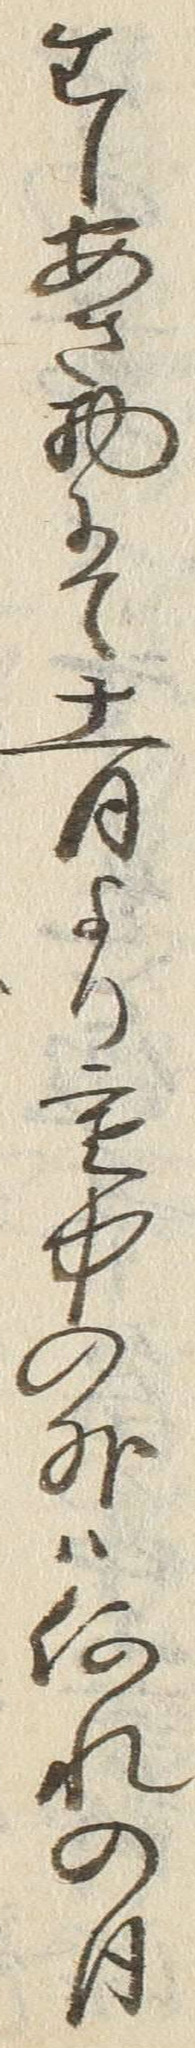生し安き物尓て十一月より寒中の外は何れの月
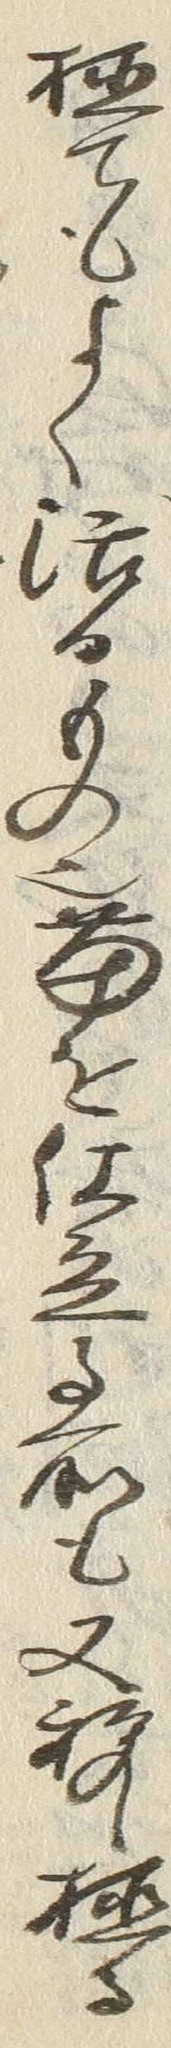植てもよく活るもの也苗を仕立る所も又移し植る
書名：養蠶實驗録後編
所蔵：東京大学農学生命科学図書館 国文学研究資料館
